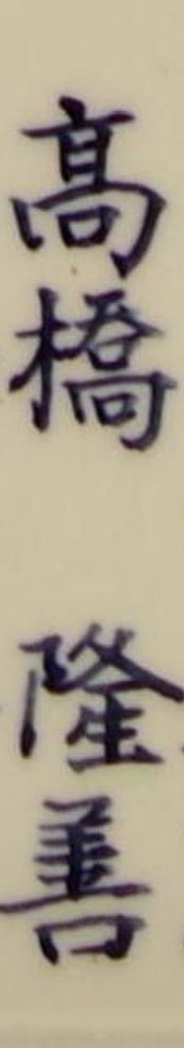高橋隆善
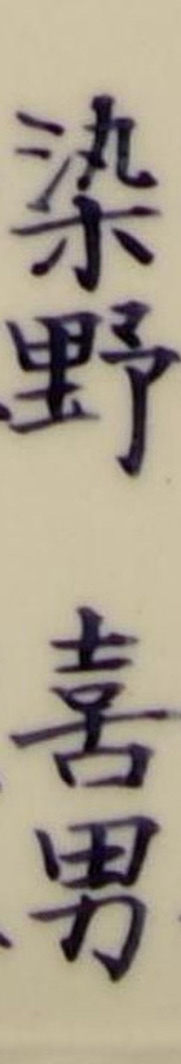染野喜男
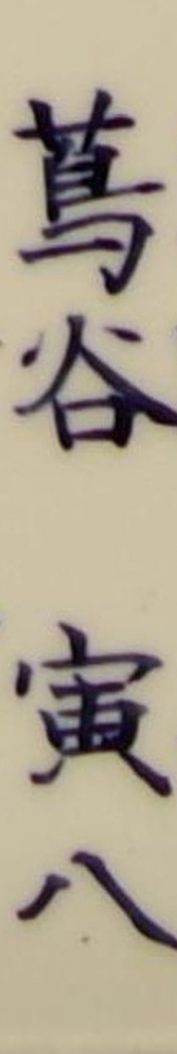蔦谷寅八
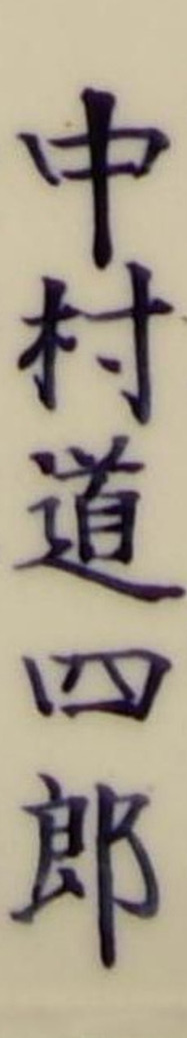中村道四郎
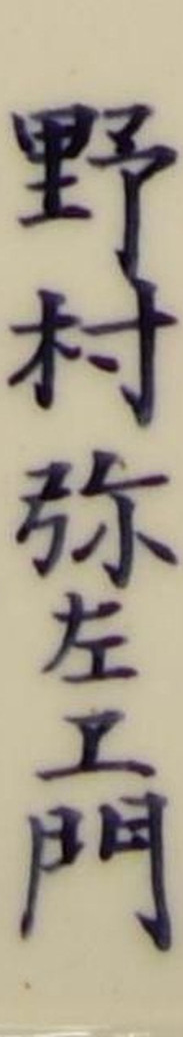野村弥左ヱ門
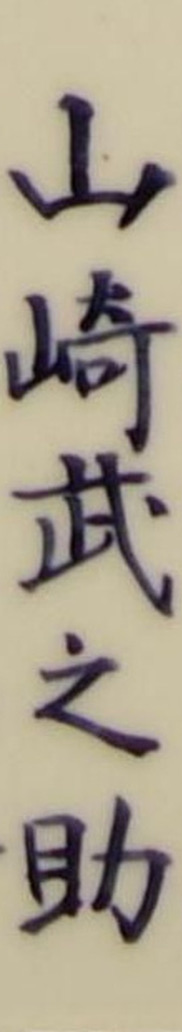山崎武之助
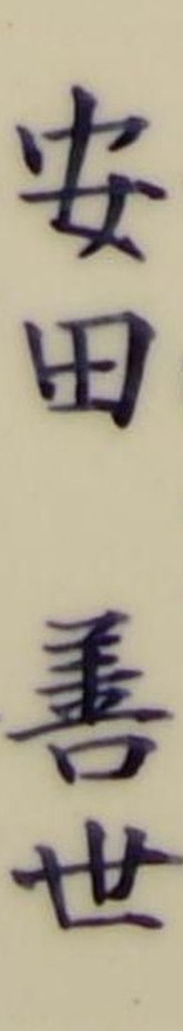安田善世
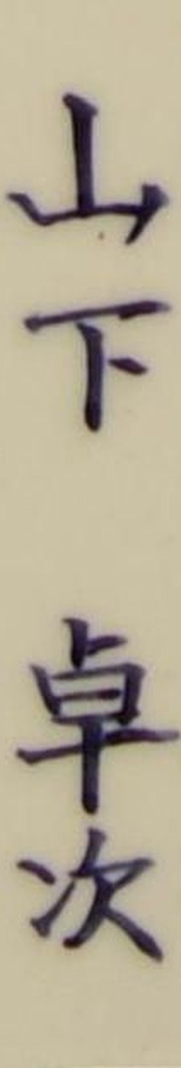山下卓次
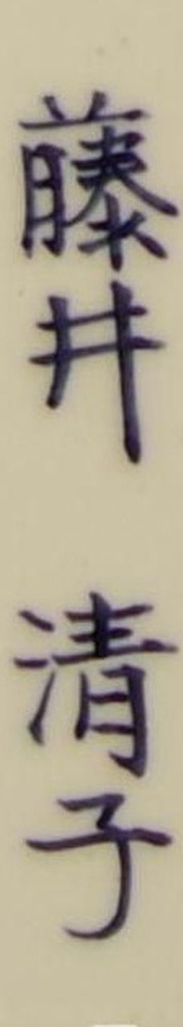藤井清子
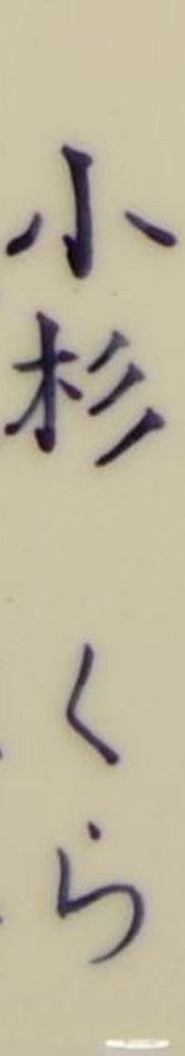小杉くら
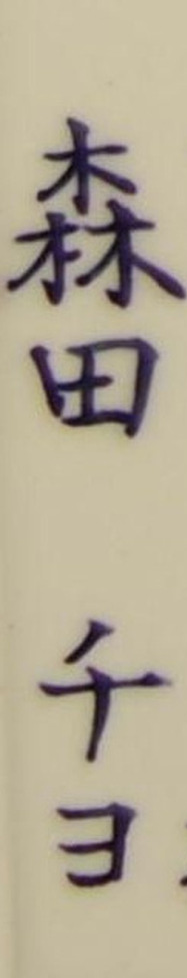森田チヨ

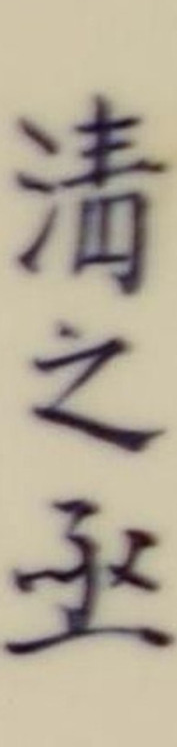清之丞
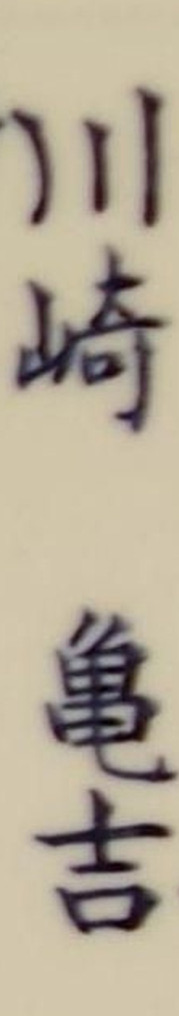川崎亀吉
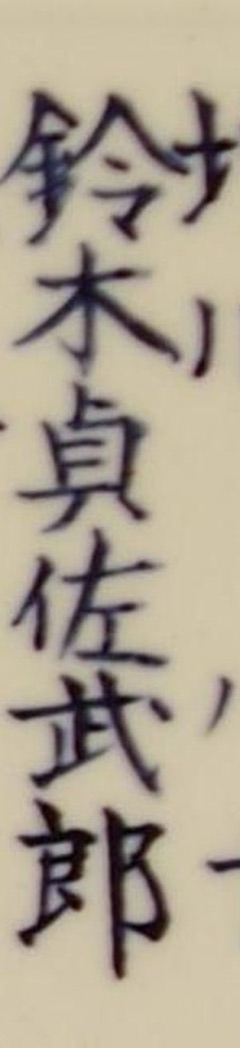鈴木貞佐武郎
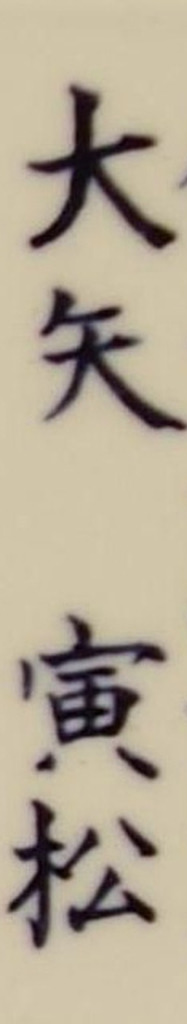大矢寅松
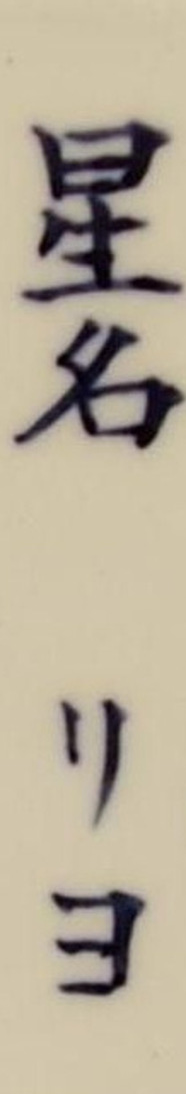星名リヨ
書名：E~L
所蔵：高野山金剛峯寺
